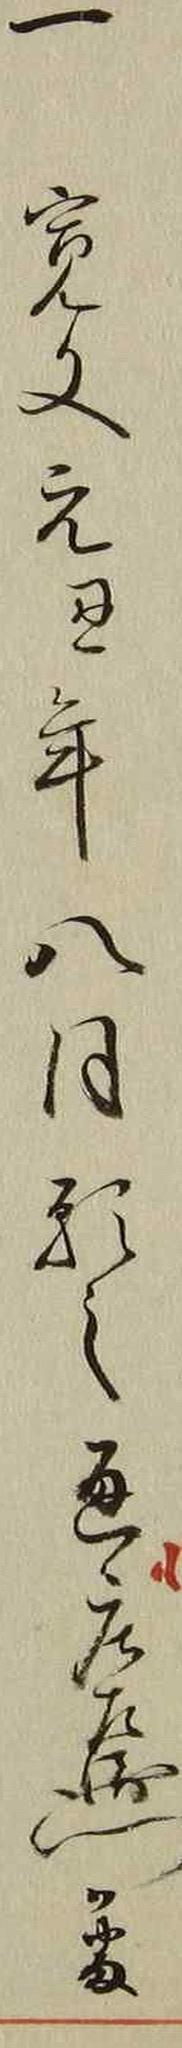一寛文元丑年八月願之通庄左衛門御番
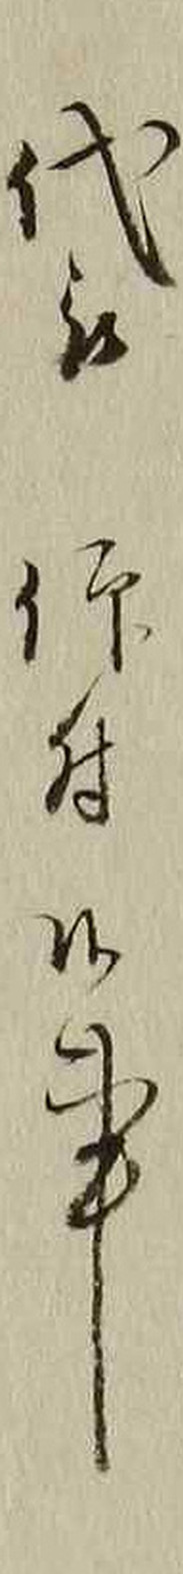代被仰付候事
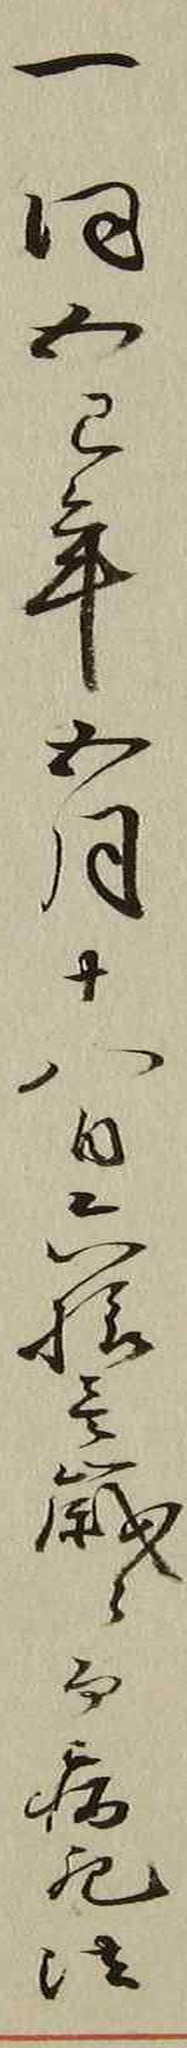一同五巳年五月十八日六拾壱歳に而病死法
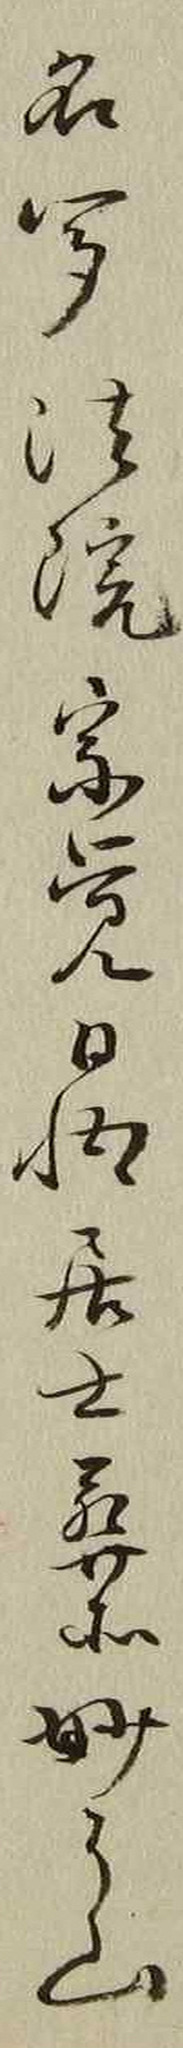名聞法院宗覚日妙居士葬所妙了山
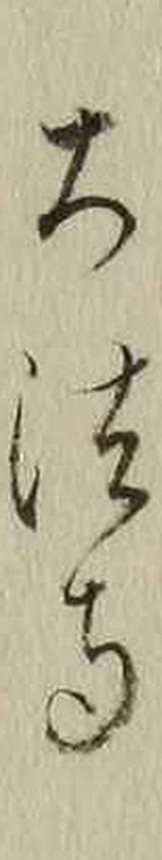大法寺
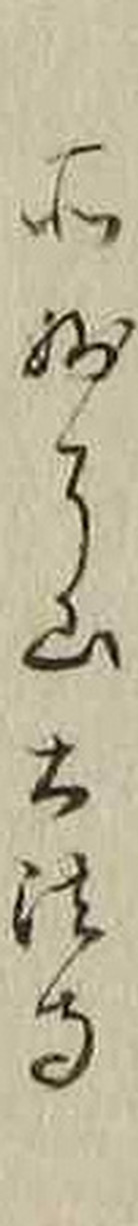所妙了山大法寺
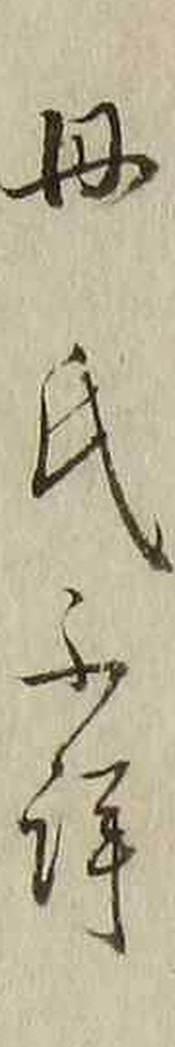母氏不詳
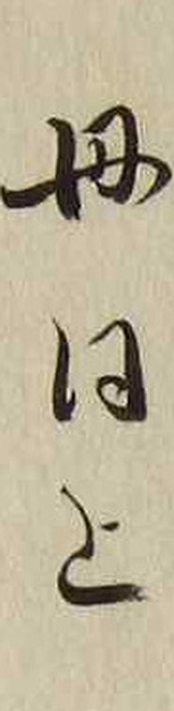母同上

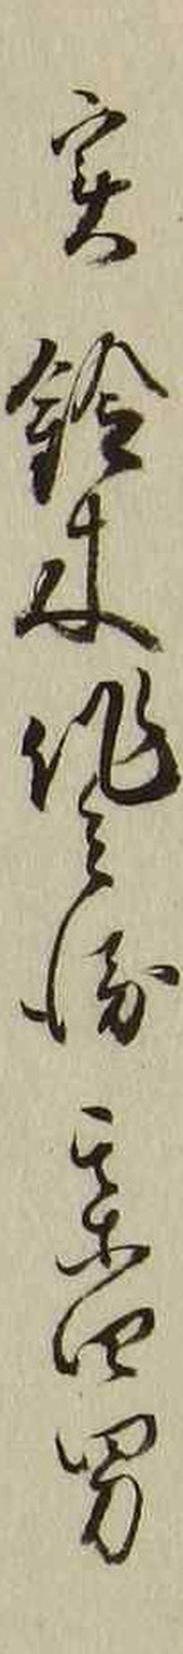実鈴木作兵衛某四男
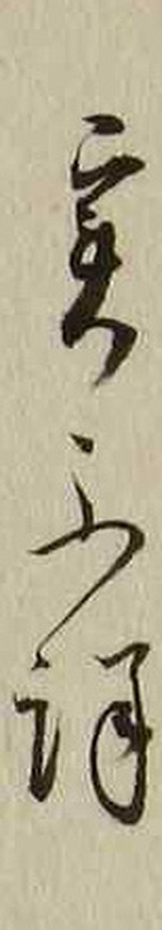実不詳
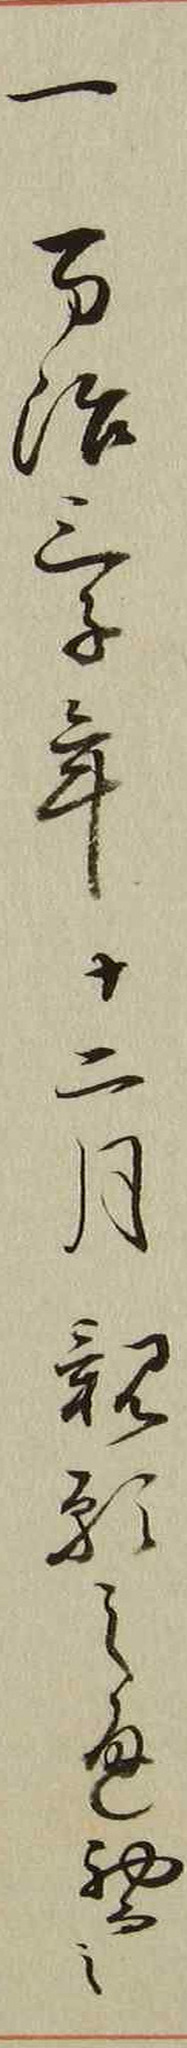一万治三子年十二月親願之通初而之
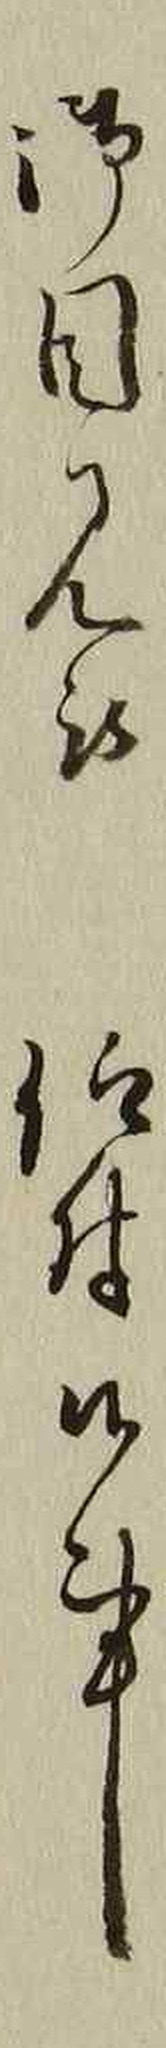御目見被仰付候事
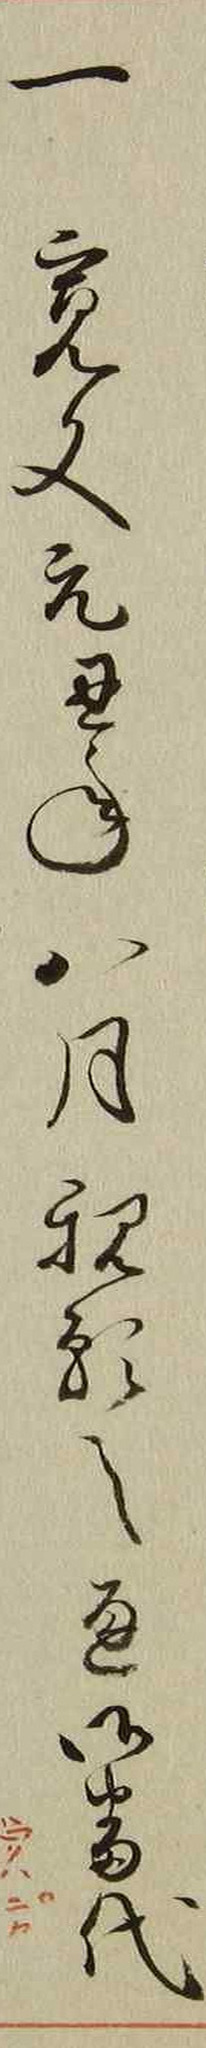一寛文元丑年八月親願之通御番代
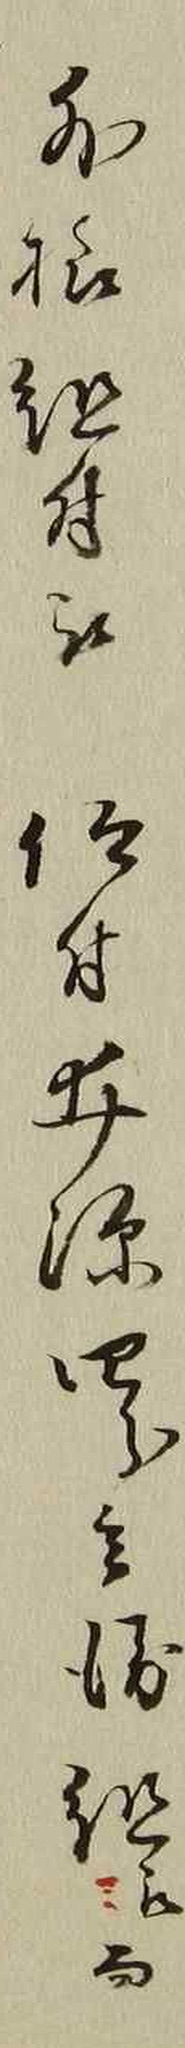外様組付被仰付井深四郎兵衛組江而
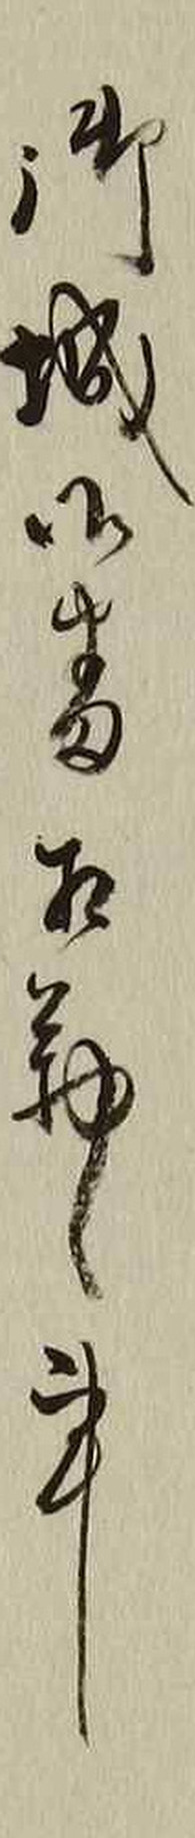御城御番相勤候事
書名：諸士系譜　巻之3　い之部3
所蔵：会津若松市立会津図書館
